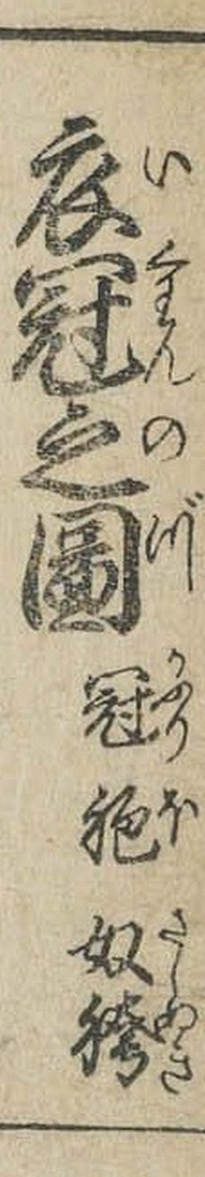衣冠之図冠袍奴袴
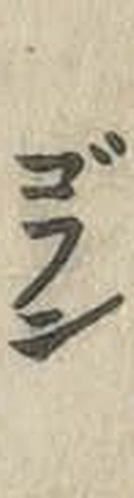ゴフン
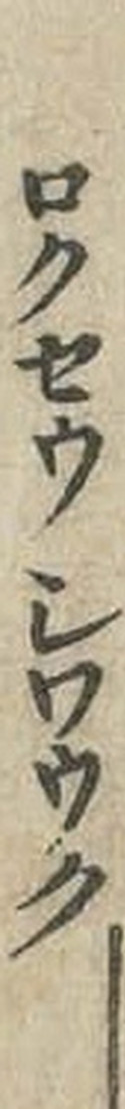ロウセウシワウク
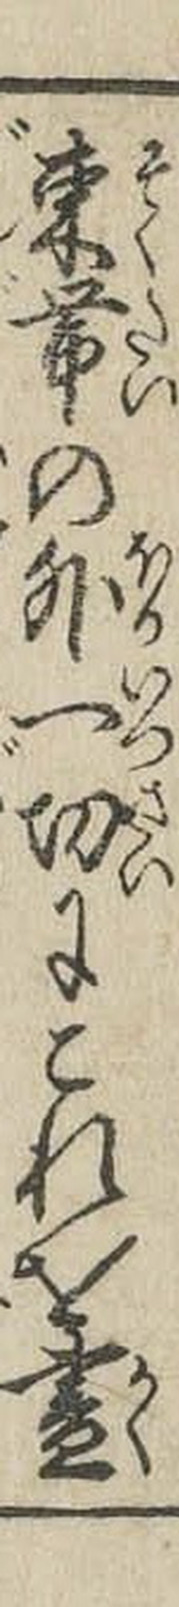束帯の外一切にこれを畫
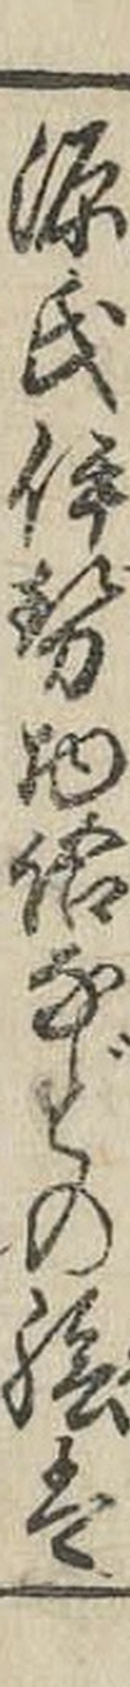源氏伊勢物語などの絵は
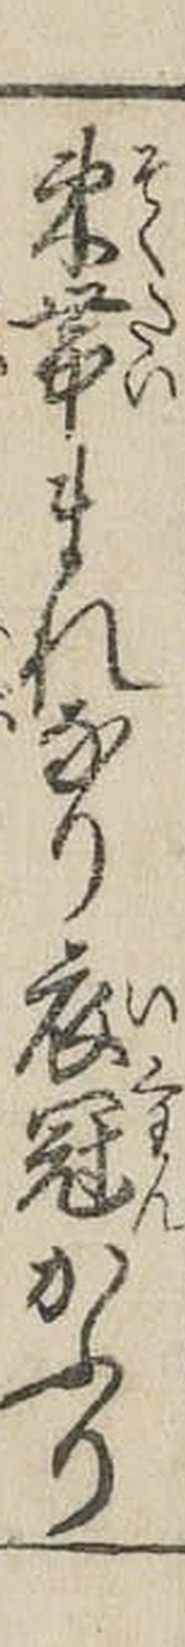束帯まれなり衣冠かふり
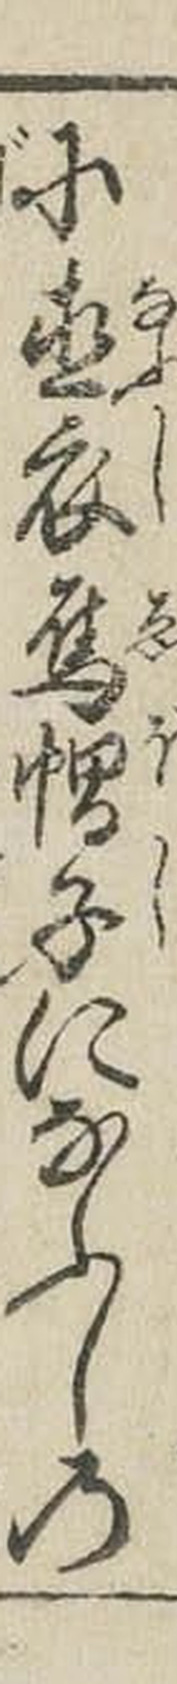に直衣烏帽子になふしの
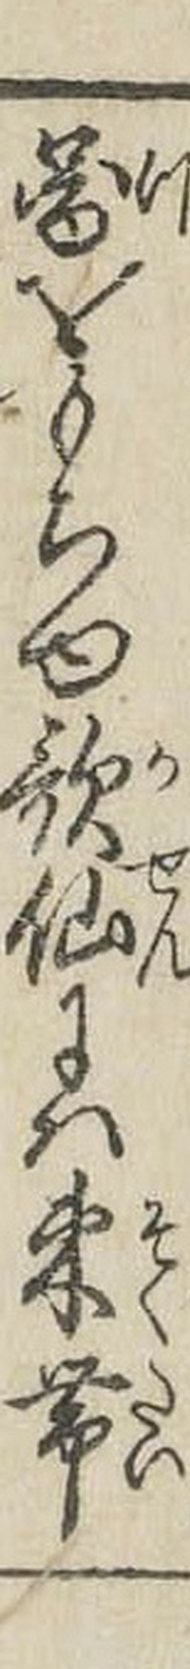図をもちゆ歌仙には束帯
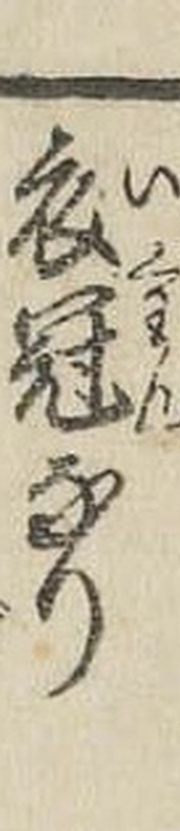衣冠なり
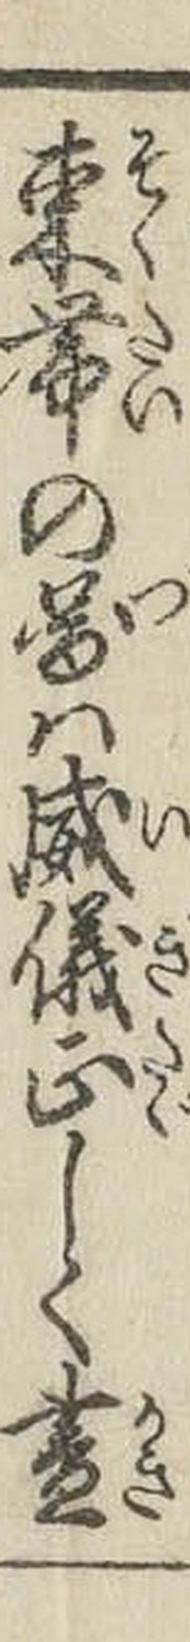束帯の図は威儀正しく畫
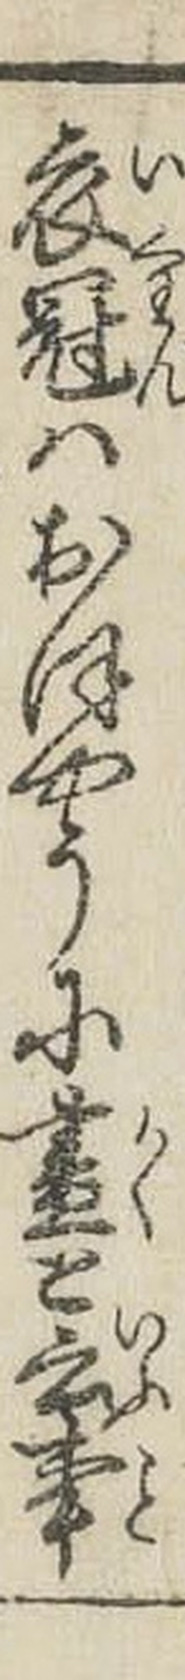衣冠はおほやうに畫と云事
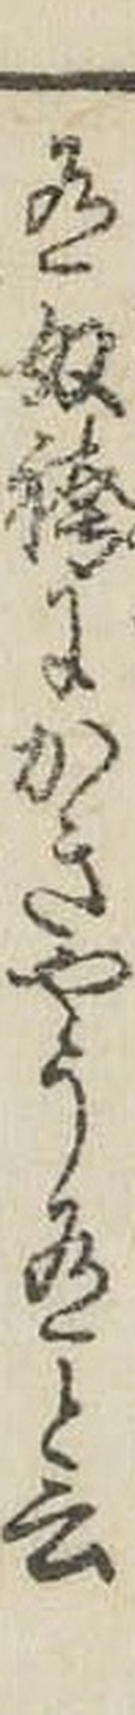有奴袴にかきやう有と云
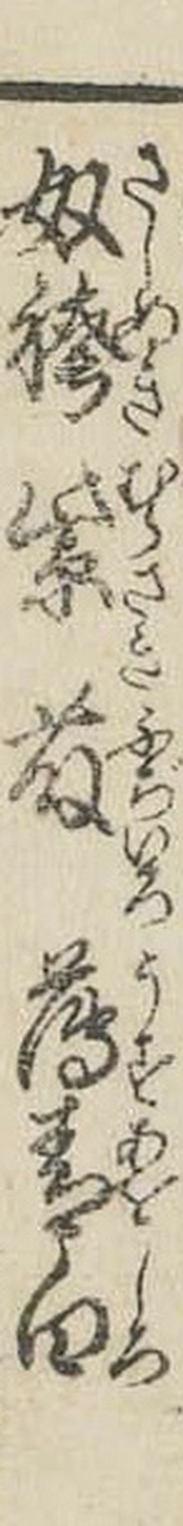奴袴紫藤薄青白
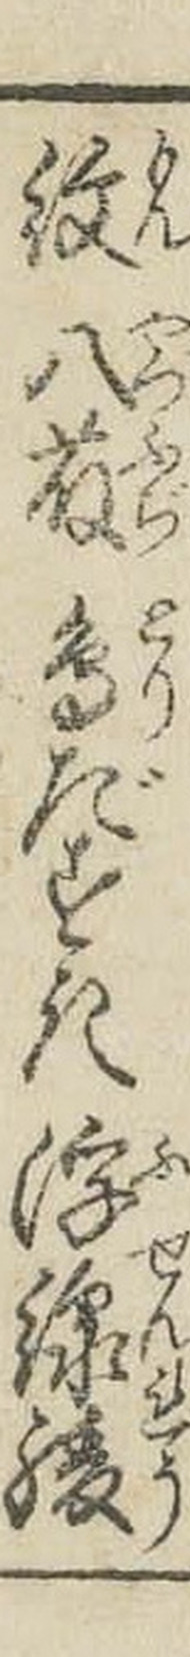紋八藤鳥だすき浮線綾
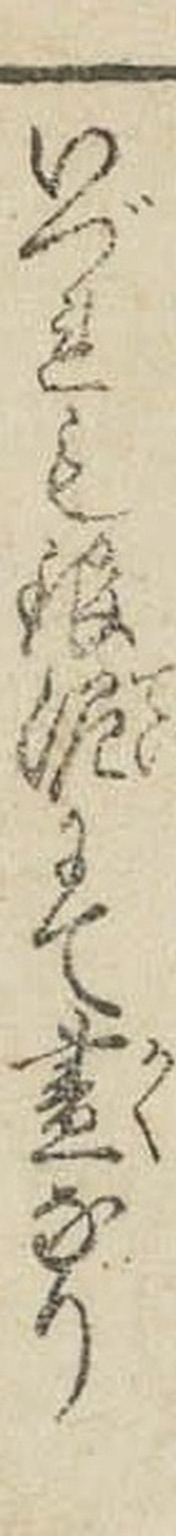いづれも銀泥にて畫なり
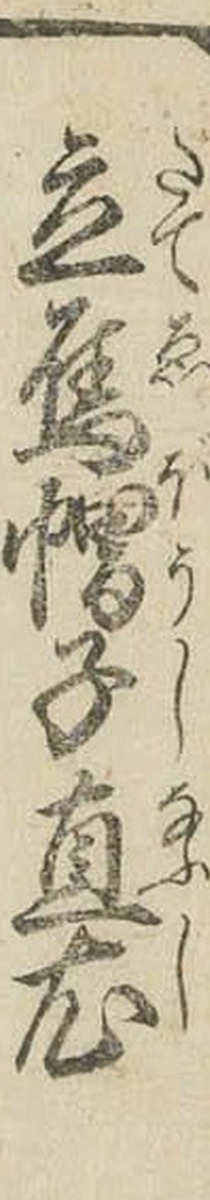立烏帽子直衣
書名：絵本写宝袋 9巻 1之巻
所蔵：東京学芸大学教育コンテンツアーカイブ
